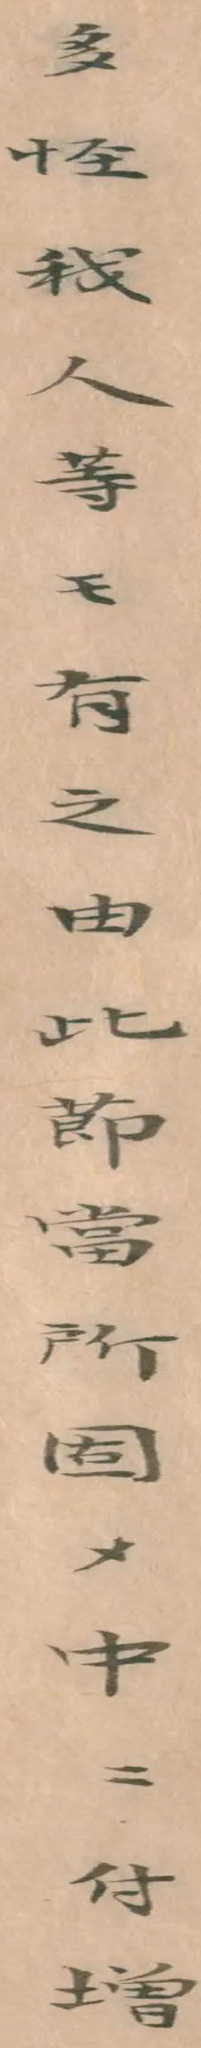多怪我人等モ有之由此節当所固メ中二付増
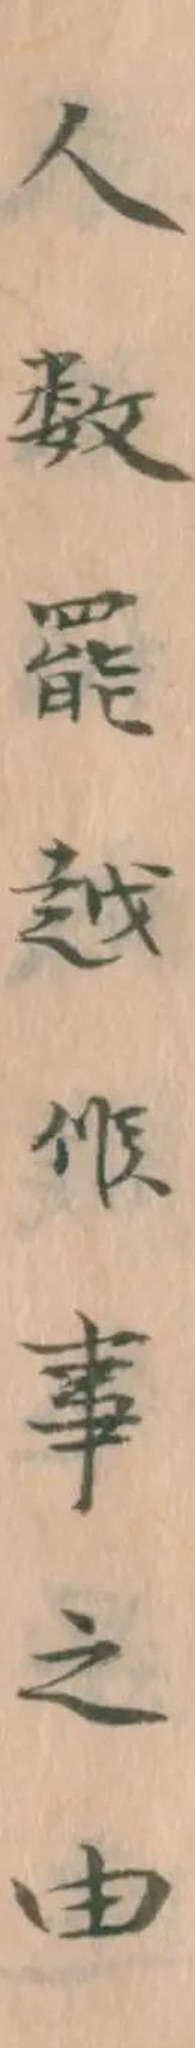人数罷越候事之由
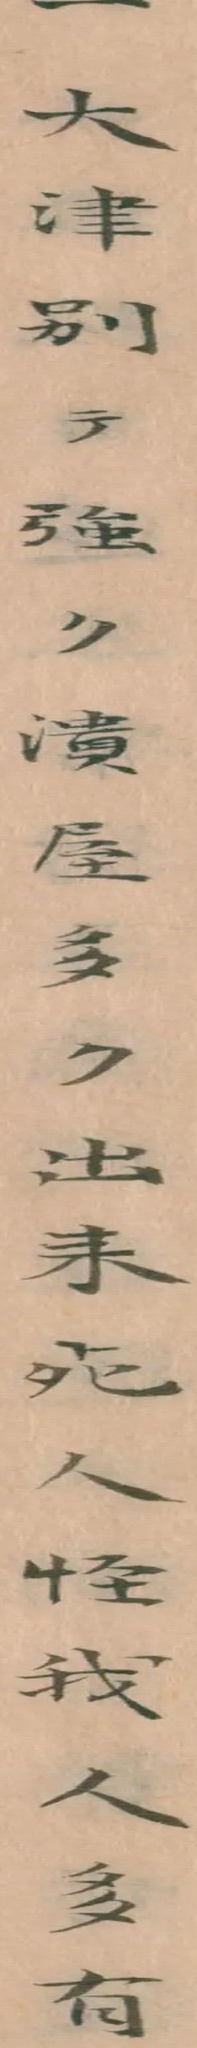一大津別テ強ク潰屋多ク出来死人怪我人多有
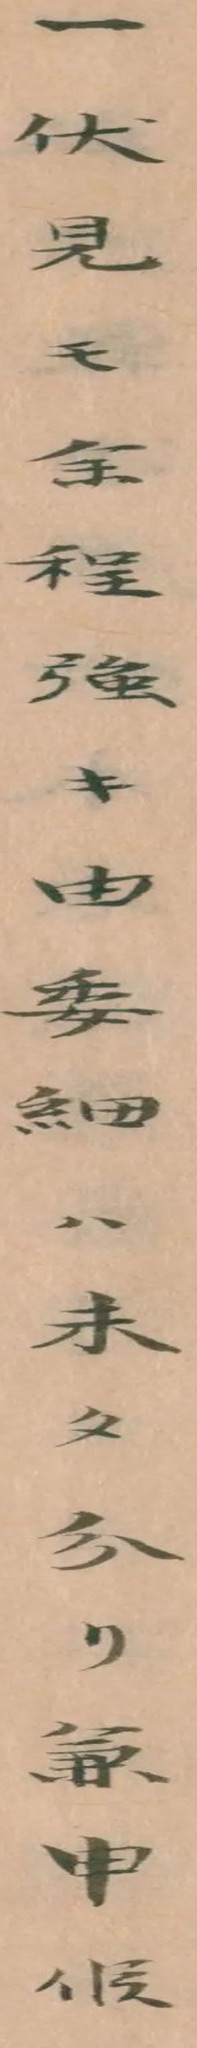一伏見モ余程強キ由委細ハ未タ分り兼申候
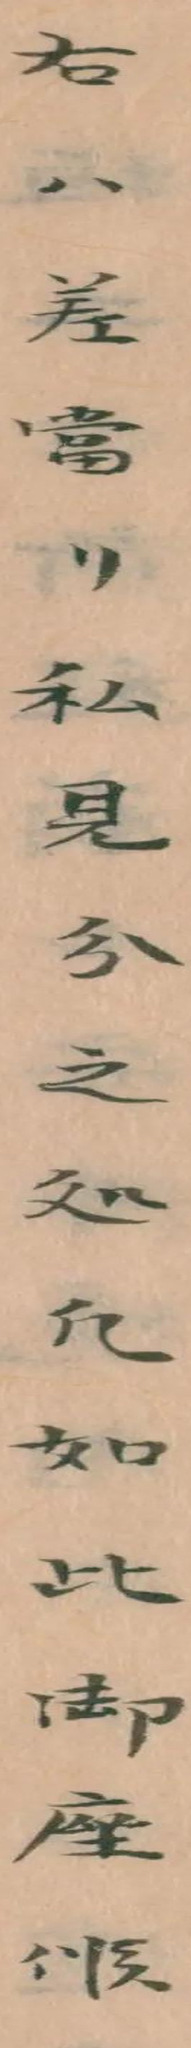右ハ差当り私見分之処凡如此御座候
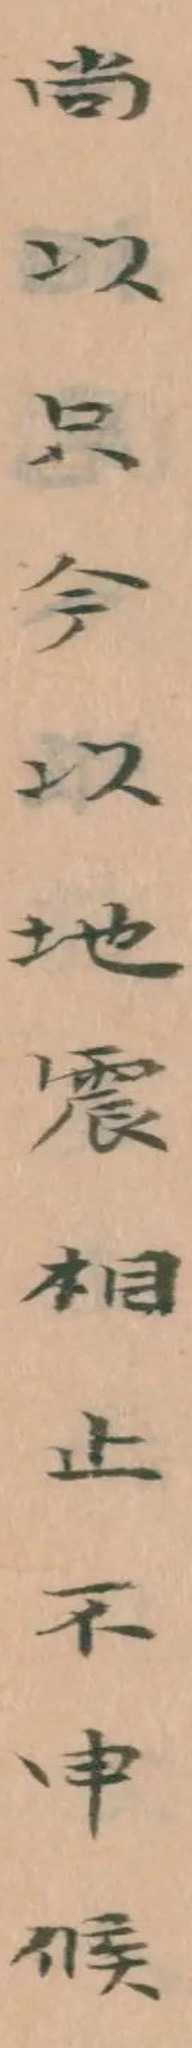尚以只今地震相止不申候
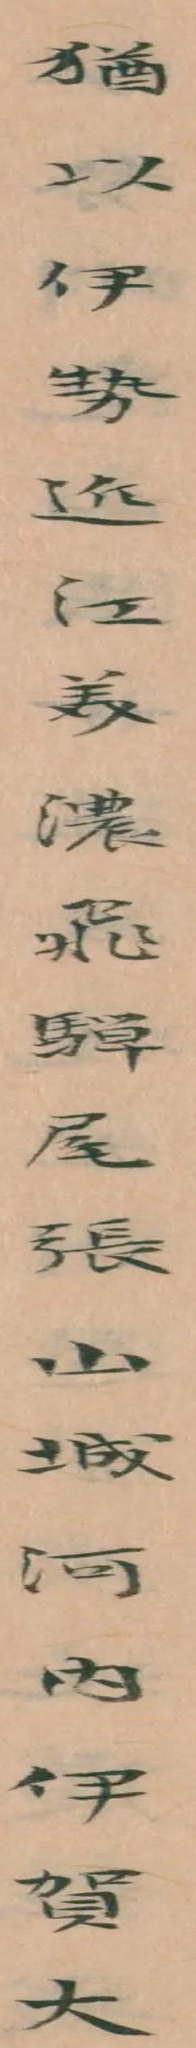猶以伊勢近江美濃飛騨尾張山城河内伊賀大
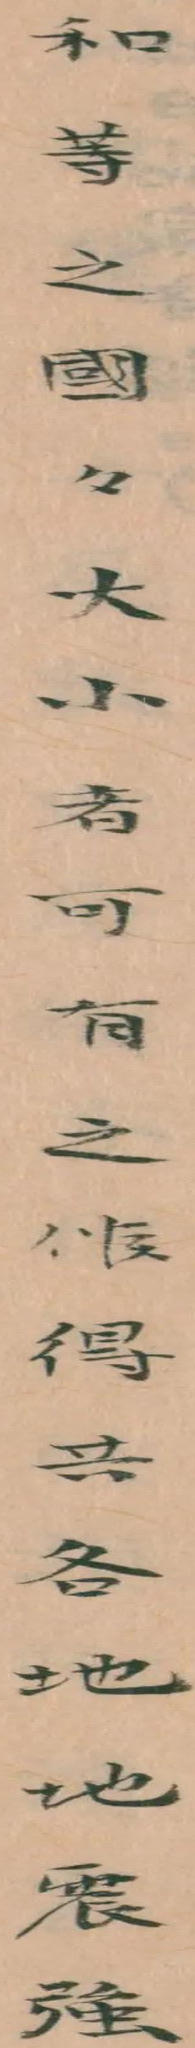和等之国々大小者可有之候得共各地地震強
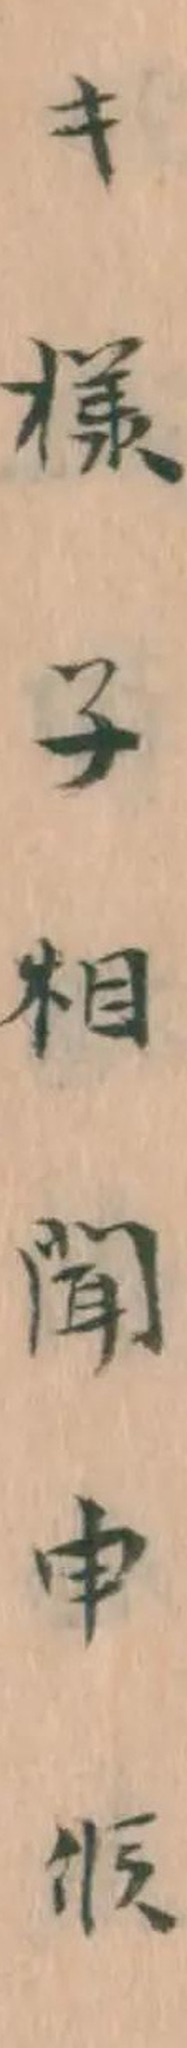キ様子相聞申候
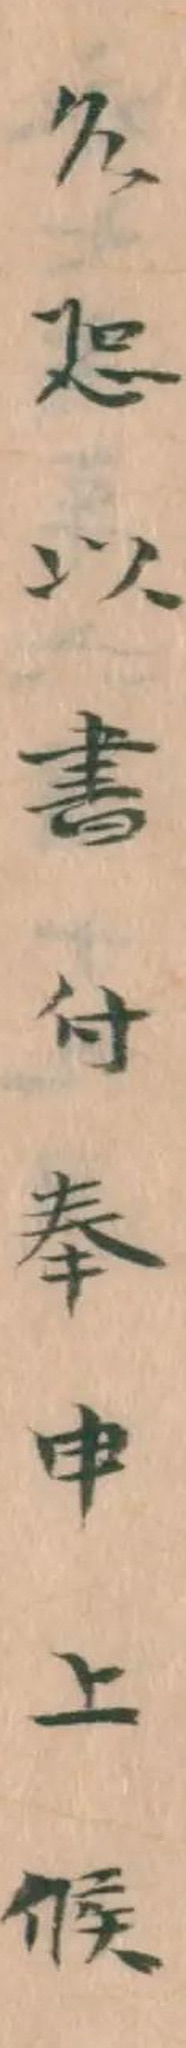乍恐以書付奉申上候
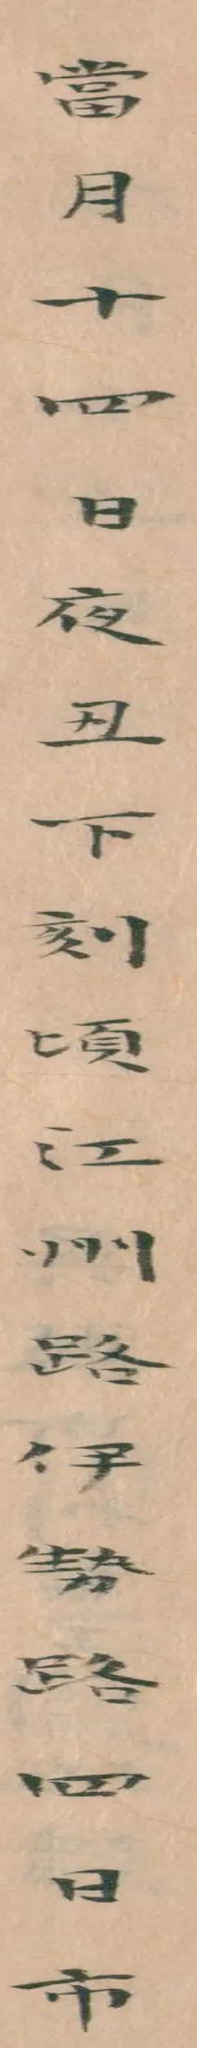一当月十四日夜丑下刻頃江州路伊勢路四日市
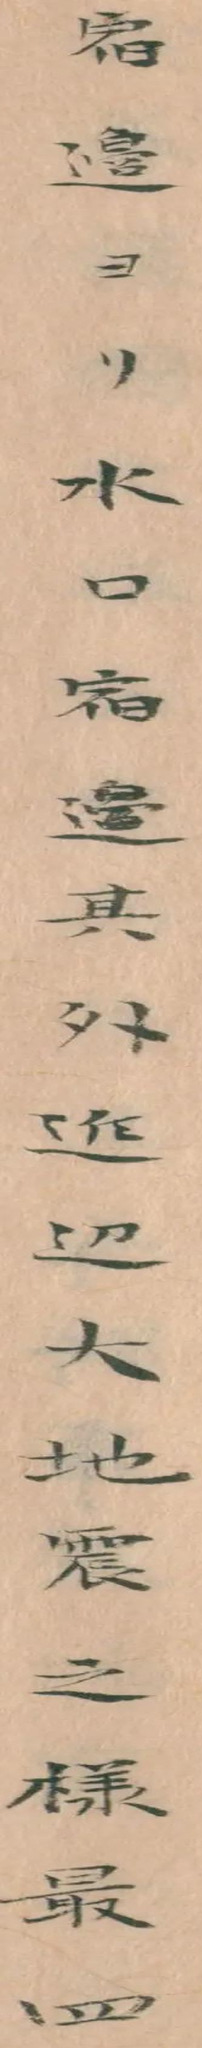宿辺ヨリ水口宿辺其外近辺大地震之様最四
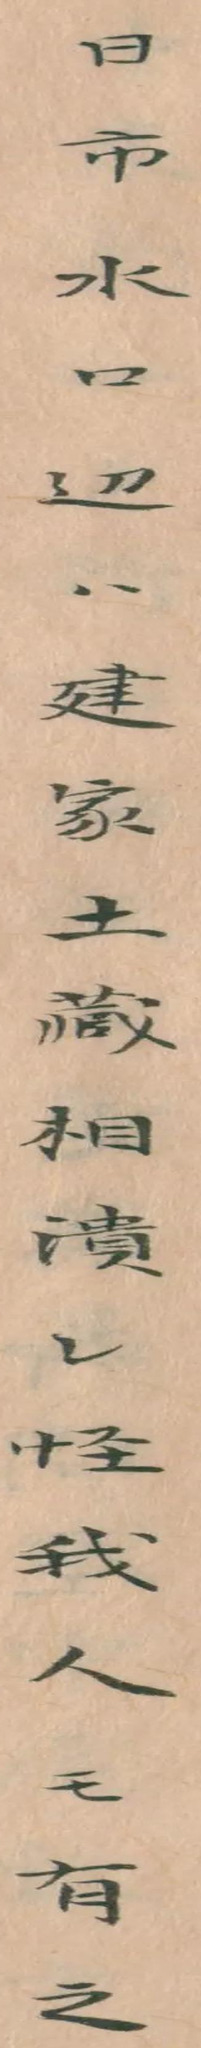日市水口辺ハ建家土蔵相潰レ怪我人モ有之
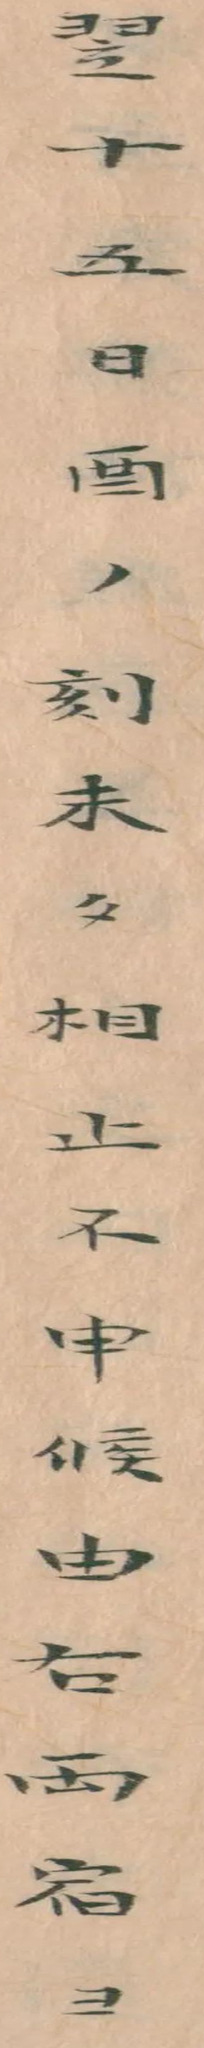翌十五日酉ノ刻未タ相止不申候由右両宿ヨ
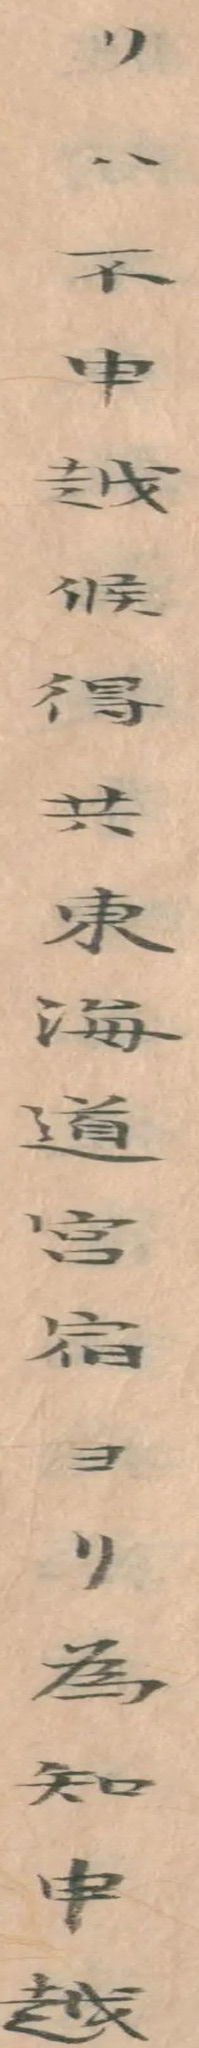リハ不申越候得共東海道宮宿ヨリ為知申越

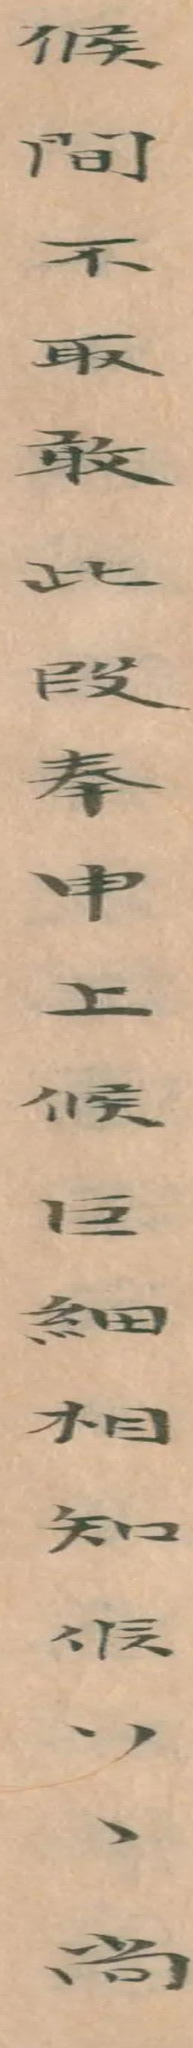候間不取敢此段奉申上候巨細相知候ハゝ尚
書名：地災撮要. 巻1(噴火山・地震ノ部)
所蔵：国立国会図書館 National Diet Library, JAPAN
